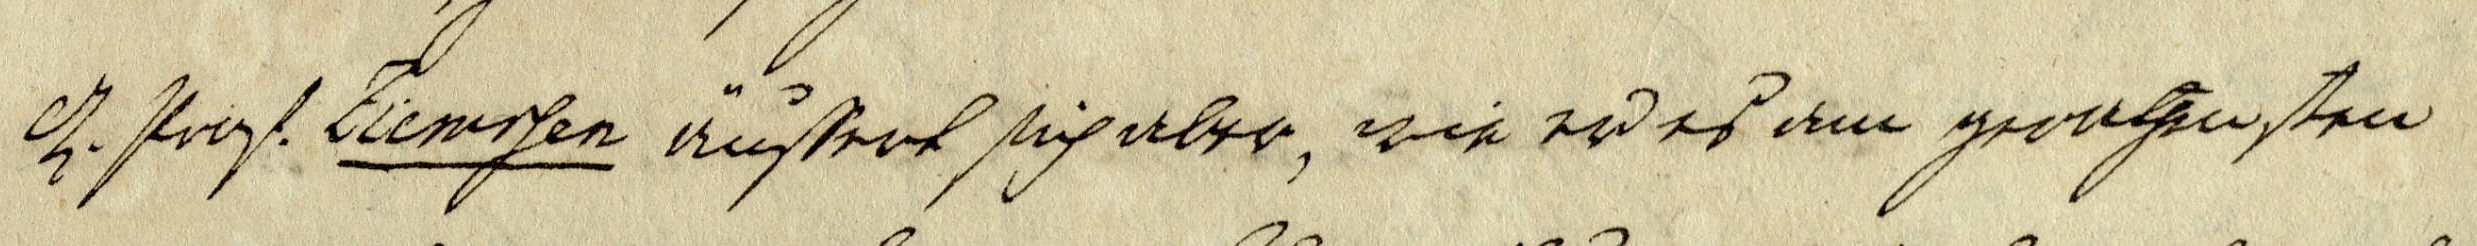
dh. Prof. Ziemssen äussert sich aber, wie er es am gerathensten
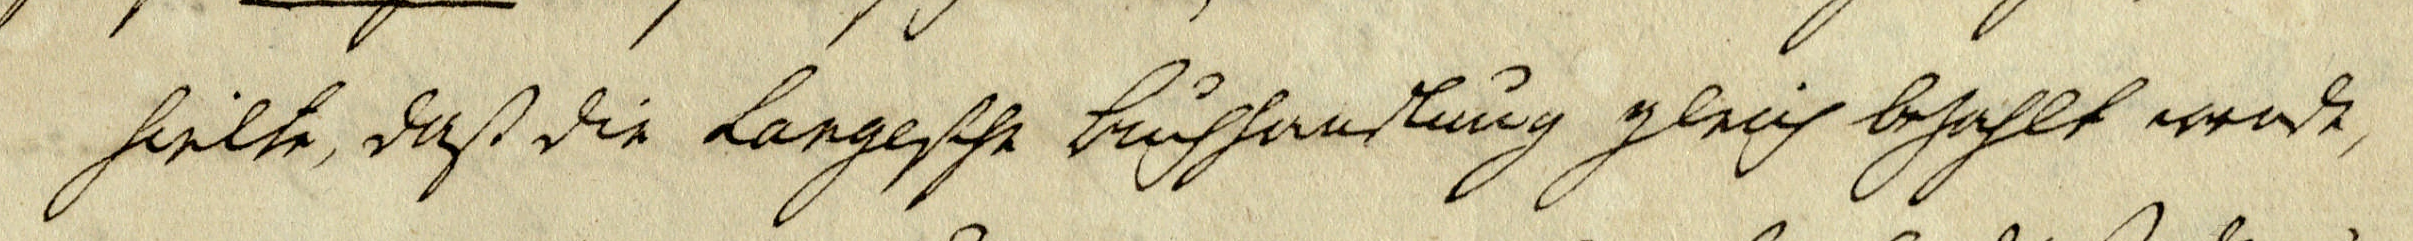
hielte, daß die Largesche Buchandlung gleich bezahlt werde,
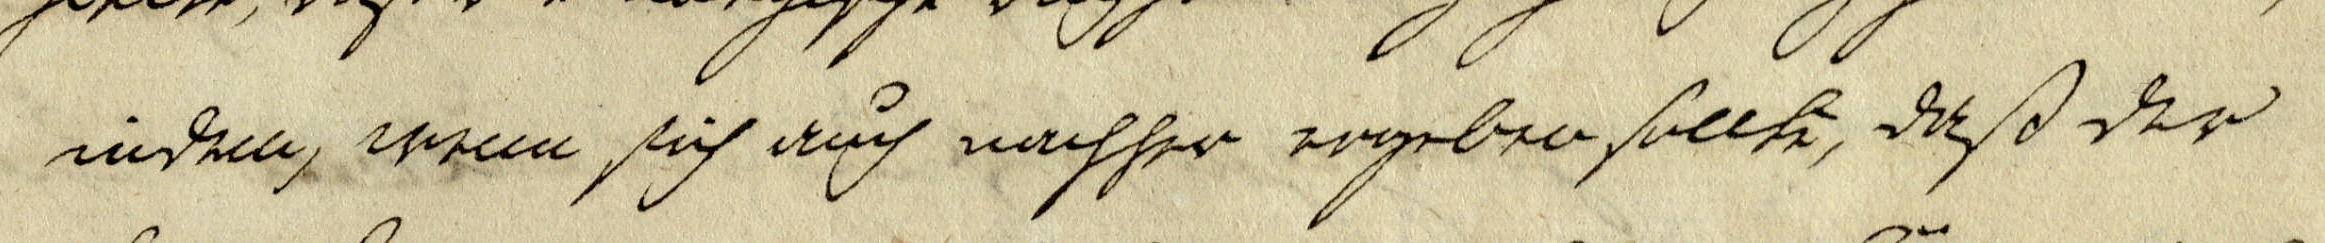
indem, wenn sich auch nachher ergeben sollte, daß der
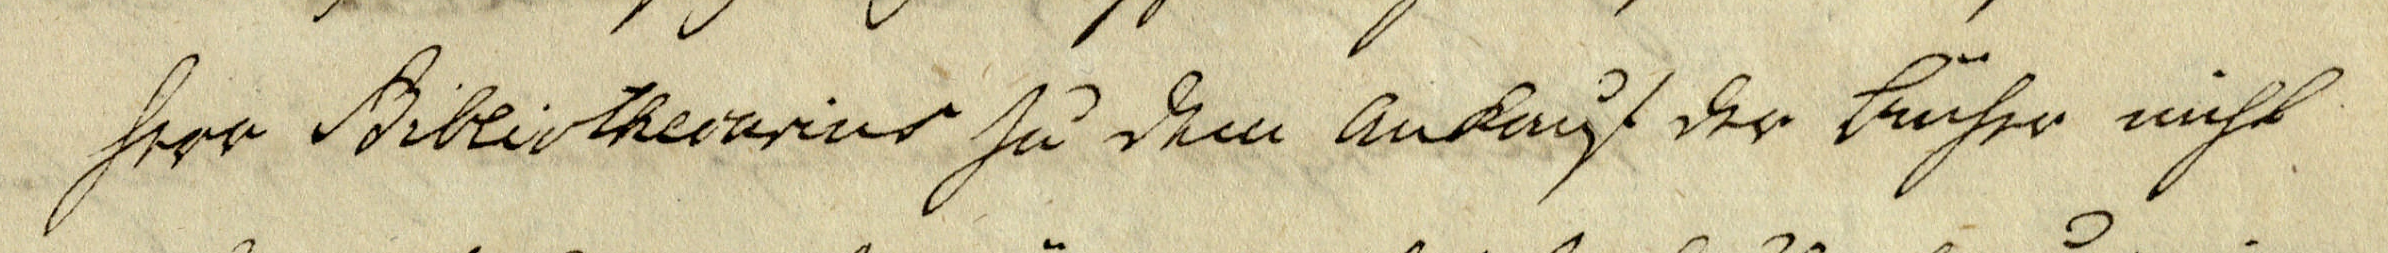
Herr Bibliothecarius zu dem Ankauf der Bücher nicht
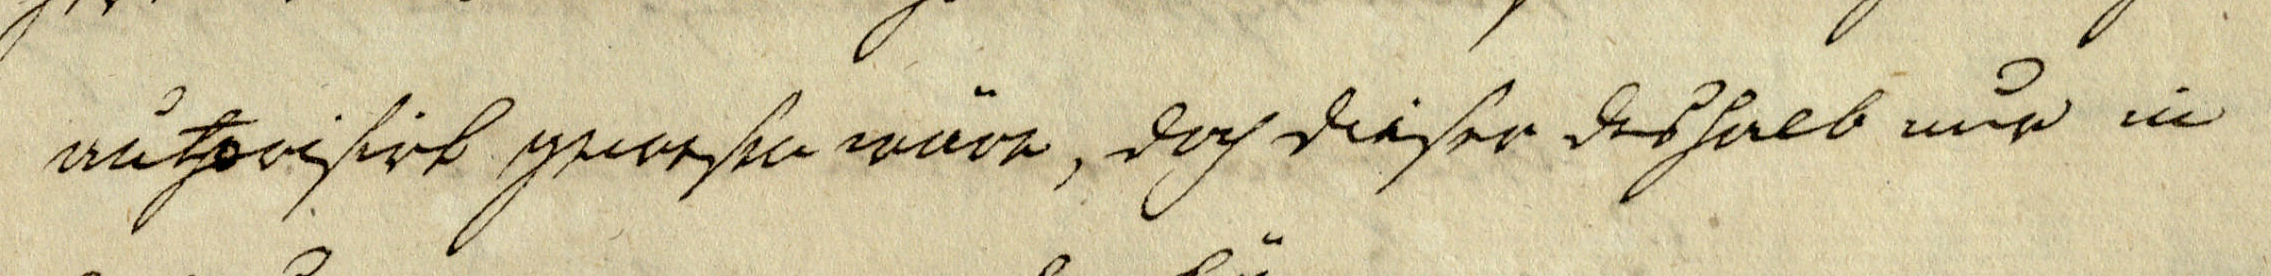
authorisirt gewesen wäre, doch dieser deshalb nur in
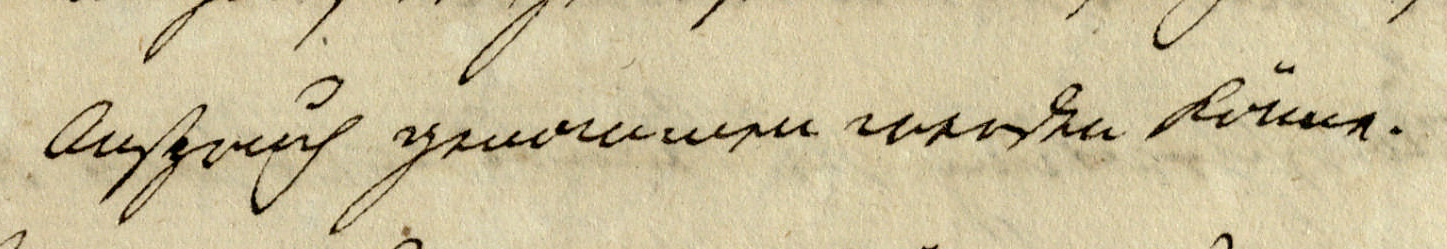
Anspruch genommen werden könne.
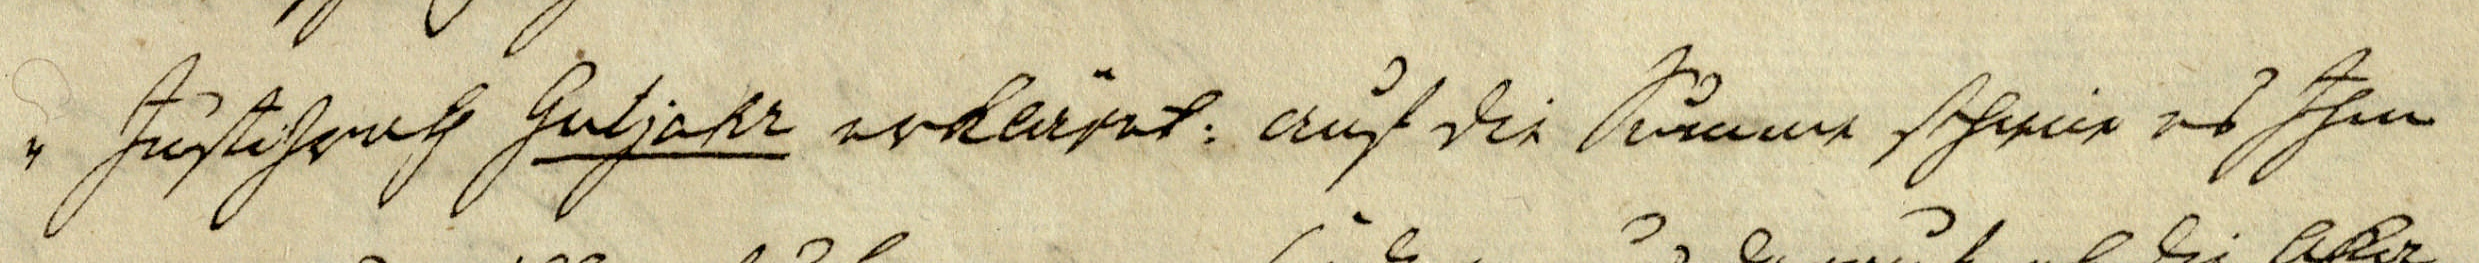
Justizrath Gutjahr erkläret: auf die Summe scheine es Ihm
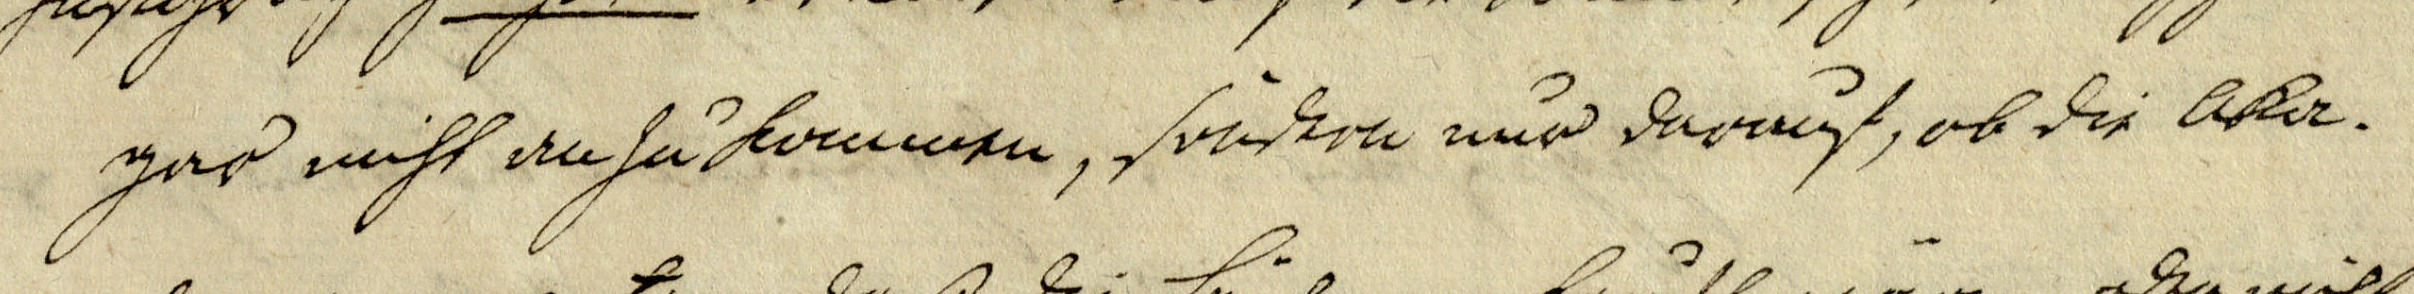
gar nicht anzukommen, sondern nur darauf, ob die Aka¬
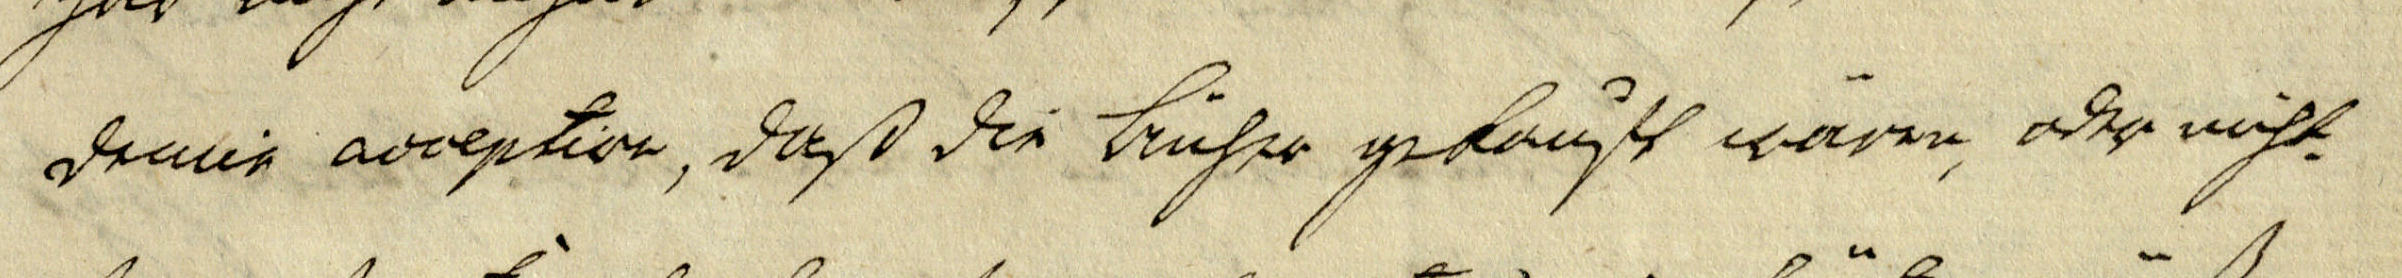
demie acceptire, daß die Bücher gekauft wären, oder nicht.
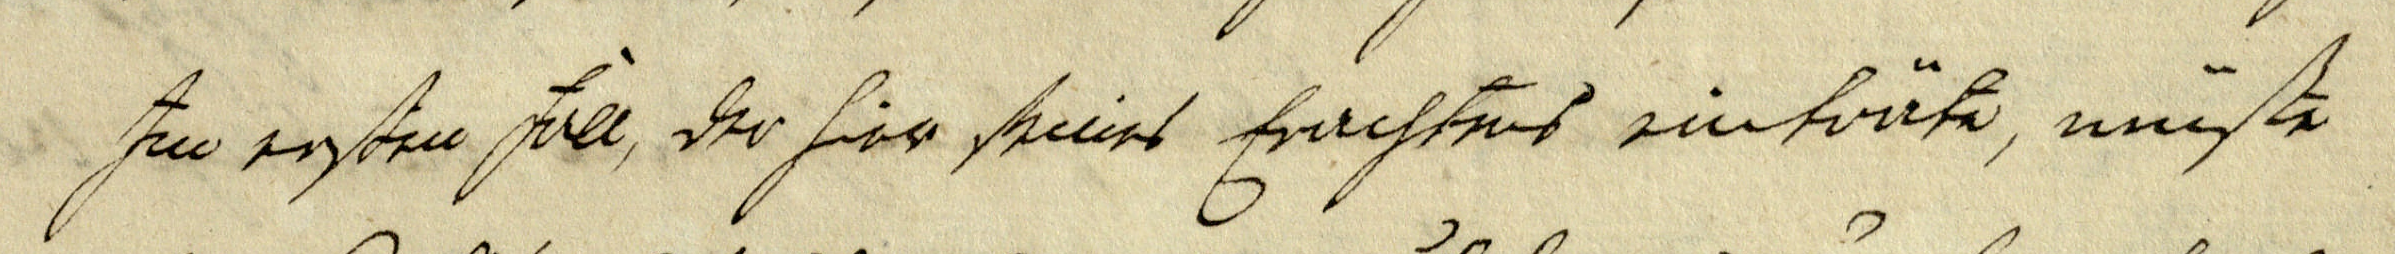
Im ersten Fall, der hier seines Erachtens einträte, müßte
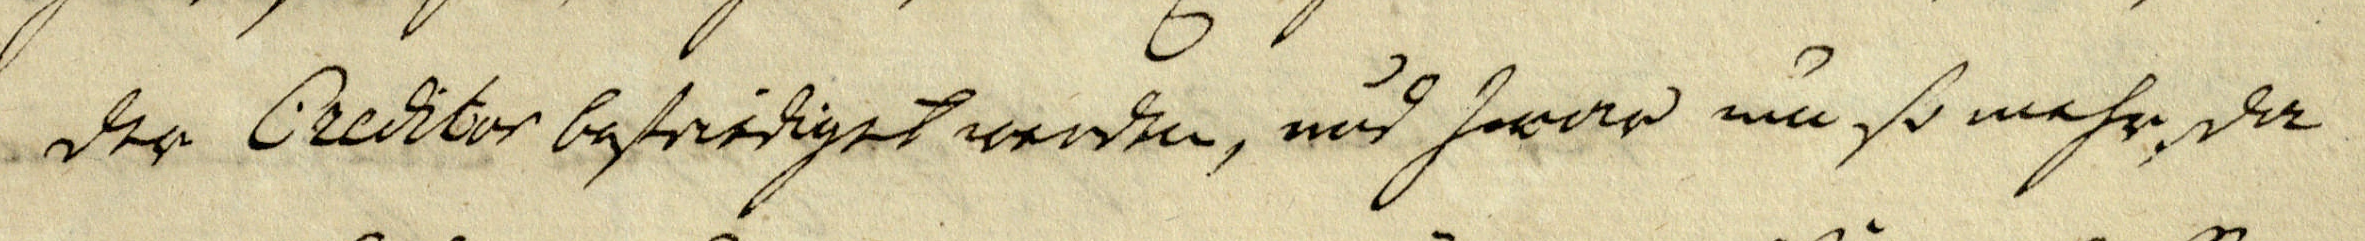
der Creditor befriediget werden, und zwar um so mehr, da
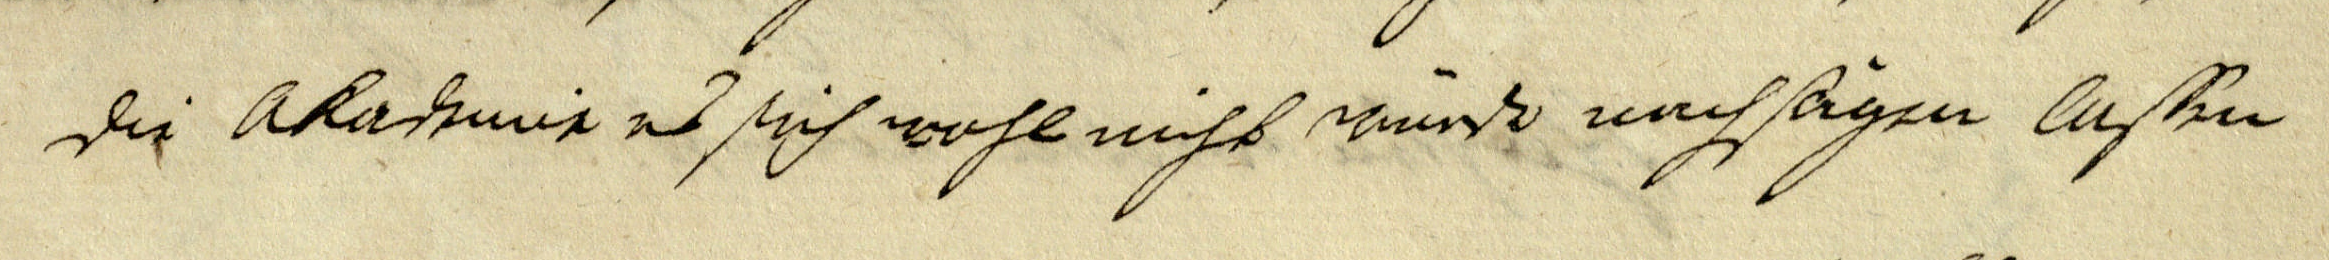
die Akademie es sich wohl nicht würde nachsagen lassen
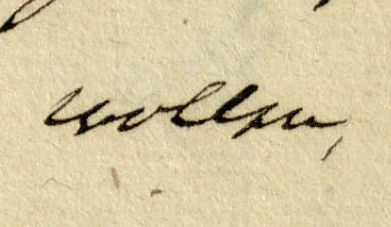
wollen
